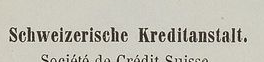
Schweizerische Kreditanstalt.
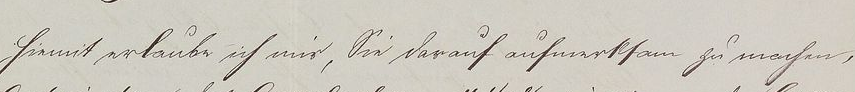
Hiemit erlaube ich mir, Sie darauf aufmerksam zu machen,
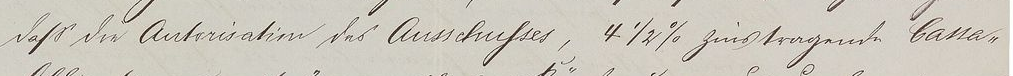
daß die Autorisation des Ausschusses, 4½% zinstragende Cassa-
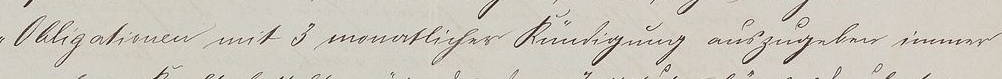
Obligationen mit 3 monatlicher Kündigung auszugeben immer
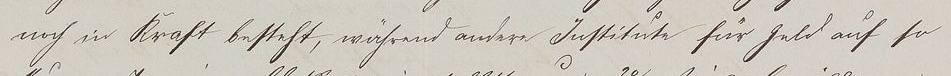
noch in Kraft besteht, während andere Institute für Geld auf so
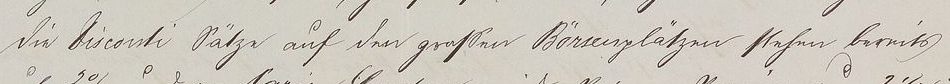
Die Disconti Sätze auf den großen Börsenplätzen stehen bereits
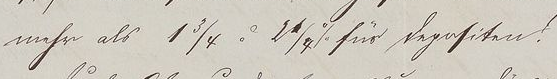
mehr als 1¾ à 2¼ für Depositen!
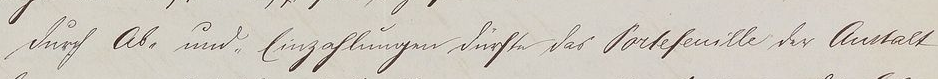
Durch Ab- und Einzahlungen dürfte das Portefeuille der Anstalt
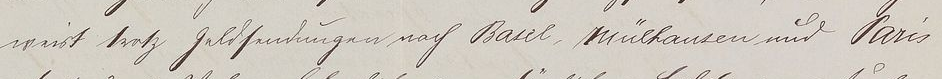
weist trotz Geldsendungen nach Basel, Mülhausen und Paris
